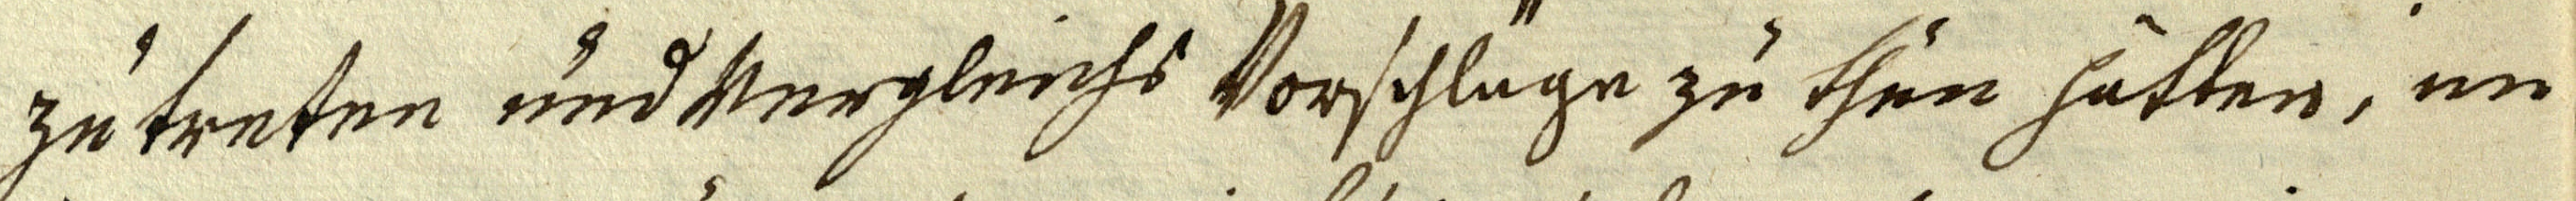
zu treten und Vergleichs Vorschläge zu thun hätten, im
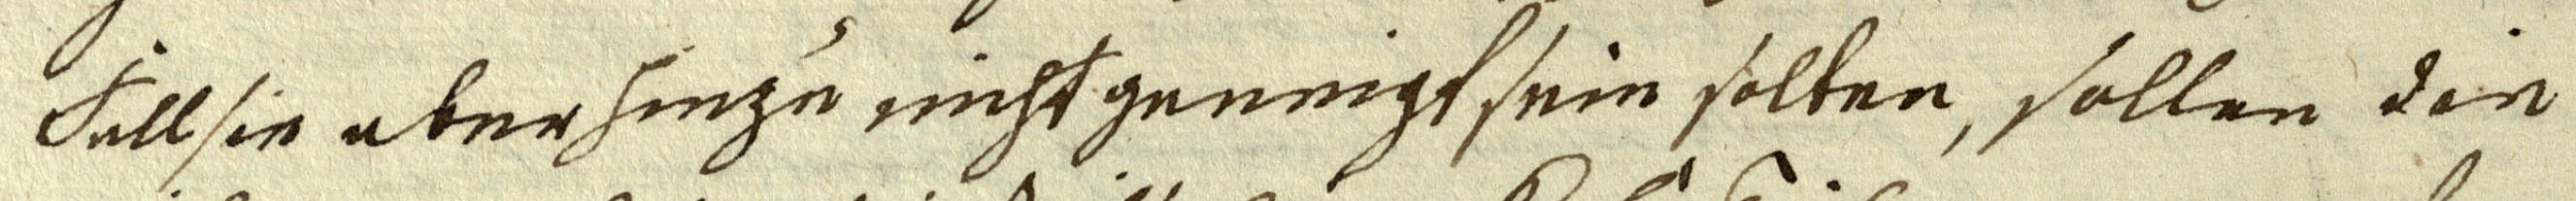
Fall sie aber hiezu nicht geneigt sein solten, sollen die
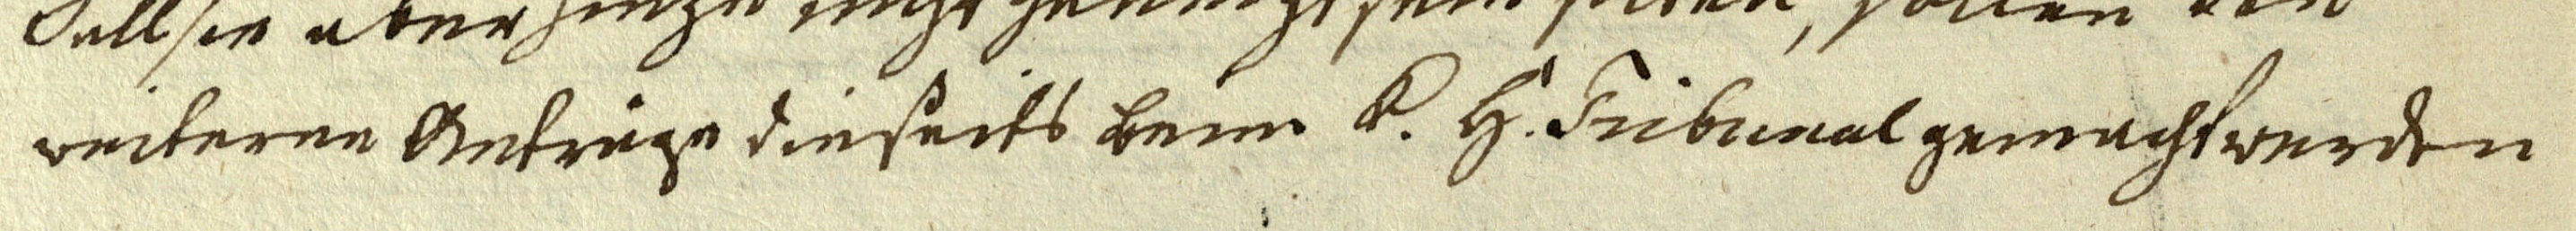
weiteren Anträge dießeits beim K. H. Tribunal gemacht werden.
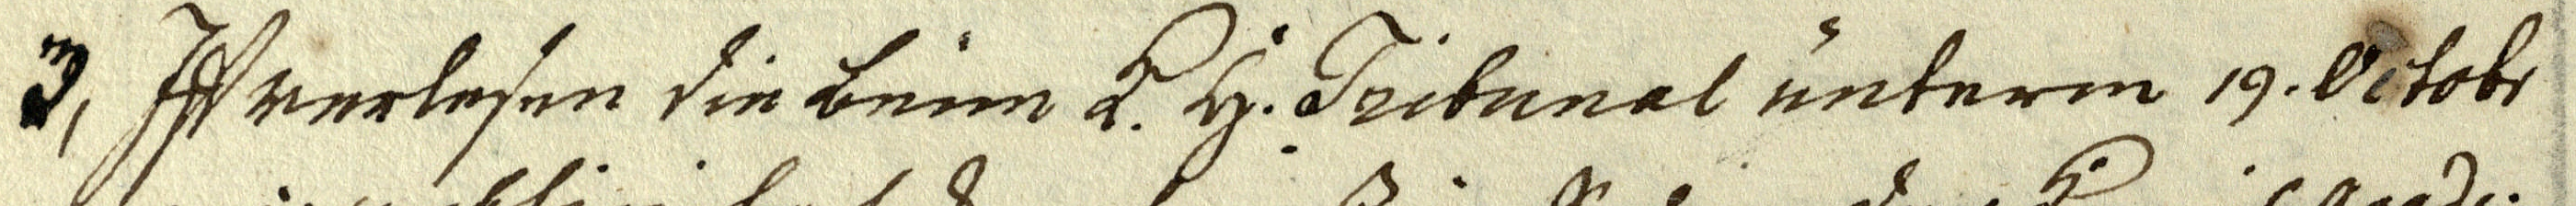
2, Ist verlesen die beim K. H. Tribunal unterm 19. Octobr.
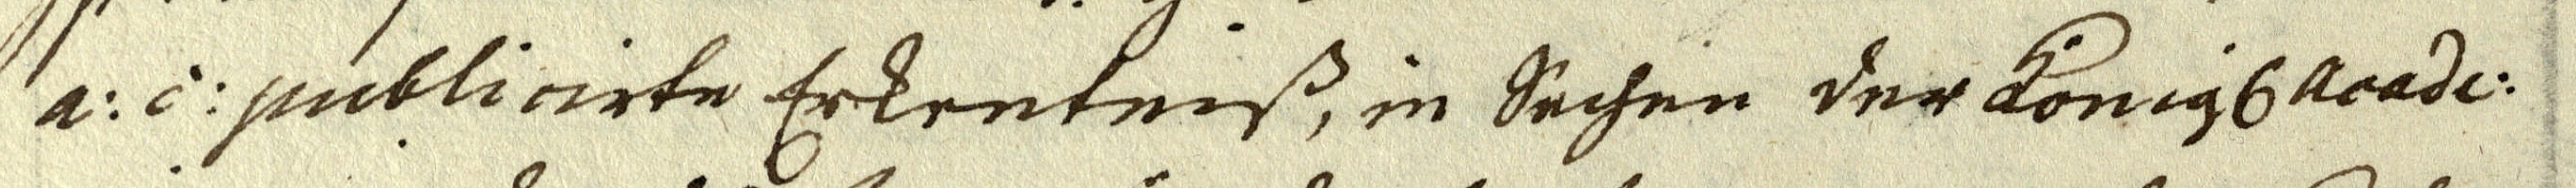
a. c. publicirte Erkentniß, in Sachen der Königl. Acade¬
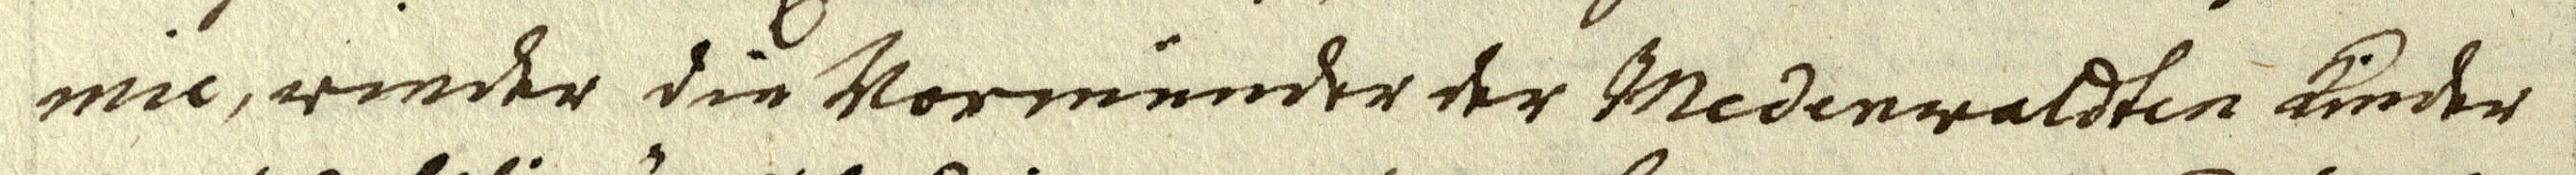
mie, wieder die Vormünder der Medenwaldten Kinder
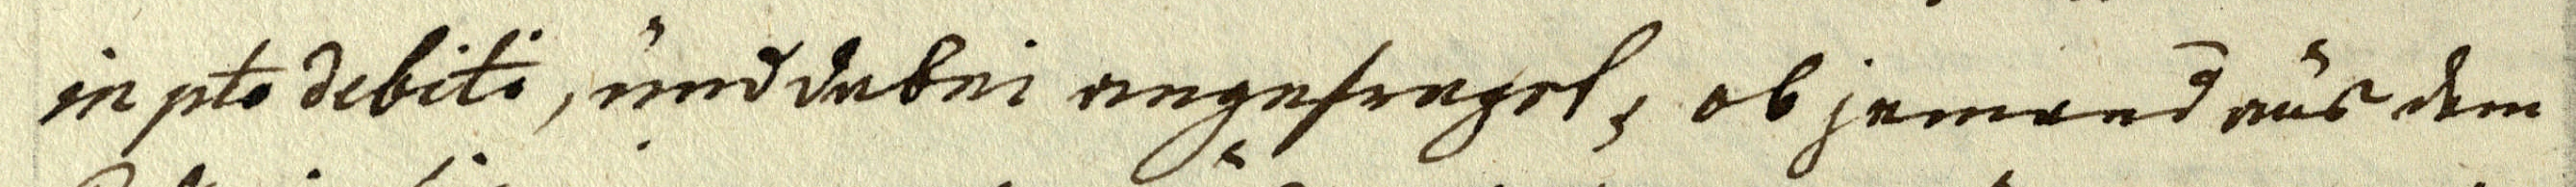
in pto debiti, und dabei angefraget, ob jemand aus dem
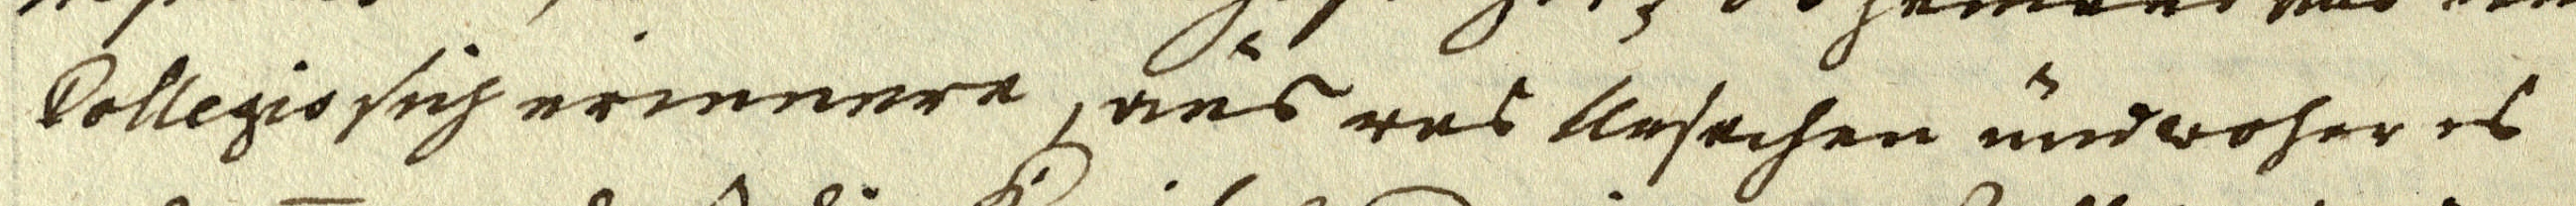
Collegio sich erinnere, aus wes Ursachen und woher es
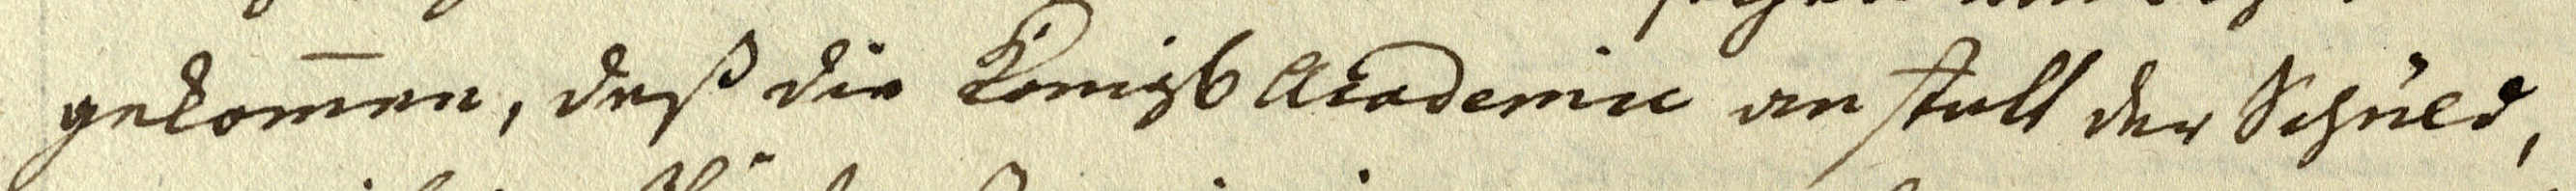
gekomen, daß die Königl. Academie anstatt der Schuld,
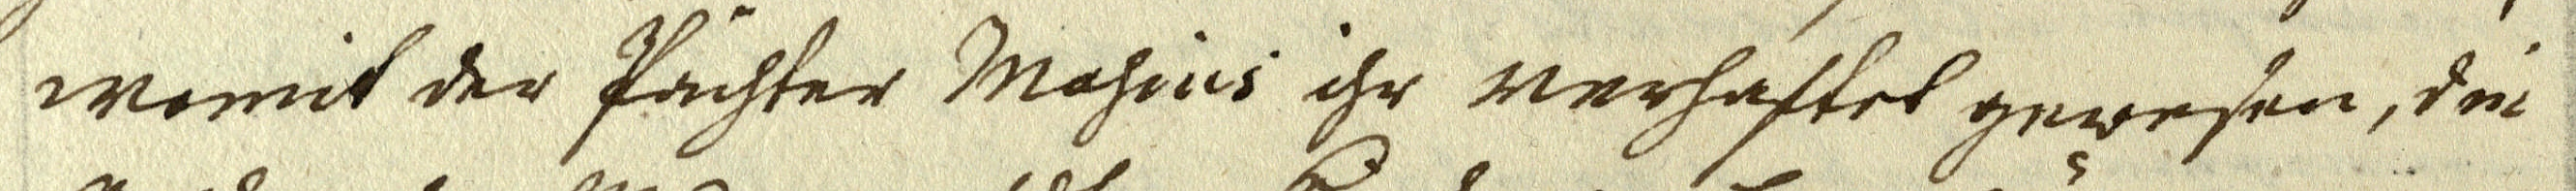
womit der Pächter Masius ihr verhaftet gewesen, die
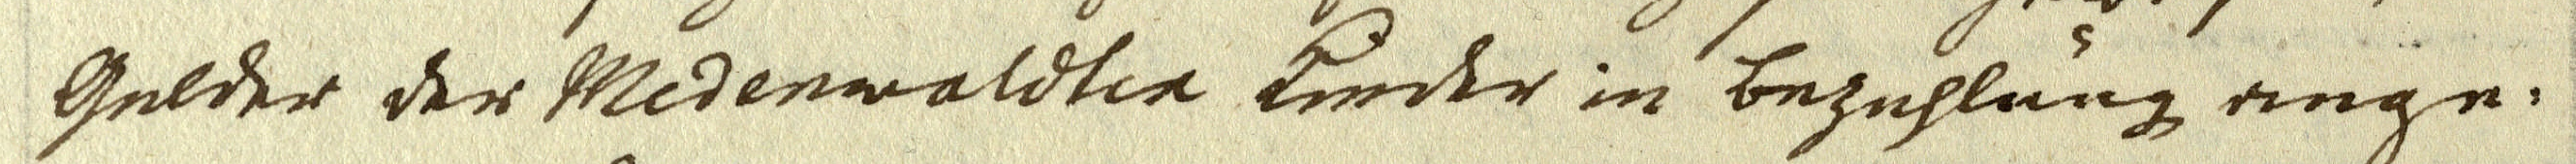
Gelder der Medenwaldten Kinder in Bezahlung ange¬
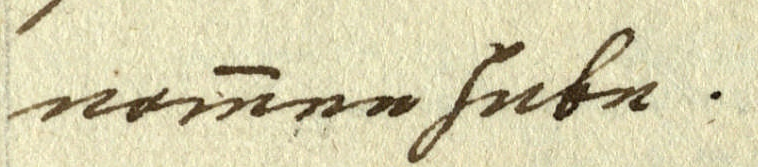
nomen habe.
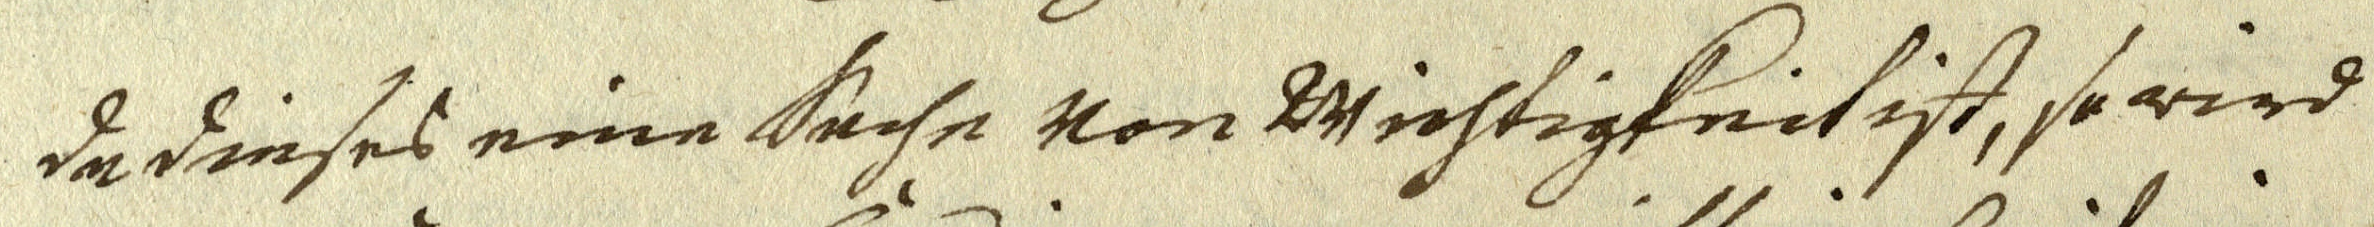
Da dieses eine Sache von Wichtigkeit ist, so wird
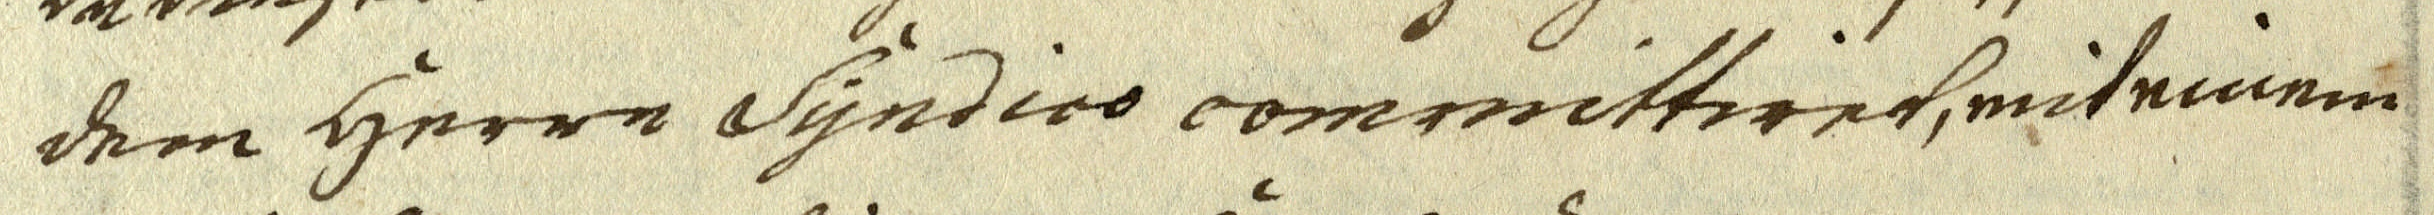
dem Herrn Sÿndico committiret, mit einem
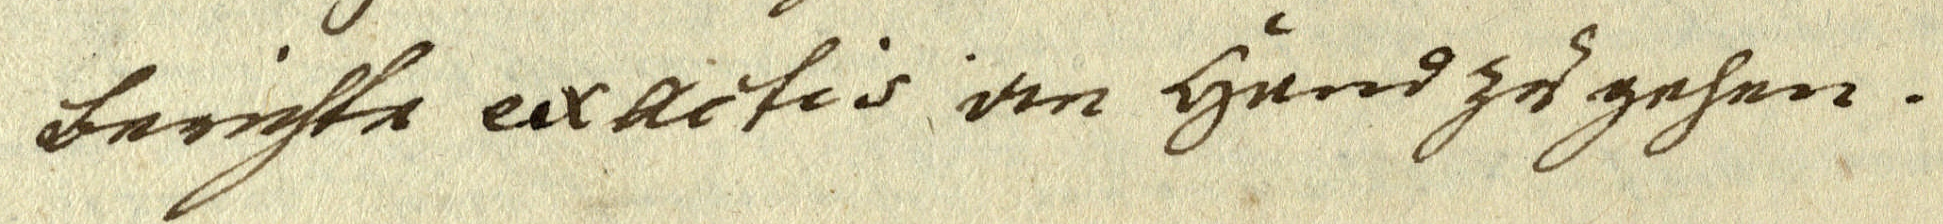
Berichte ex Actis an Hand zu gehen.
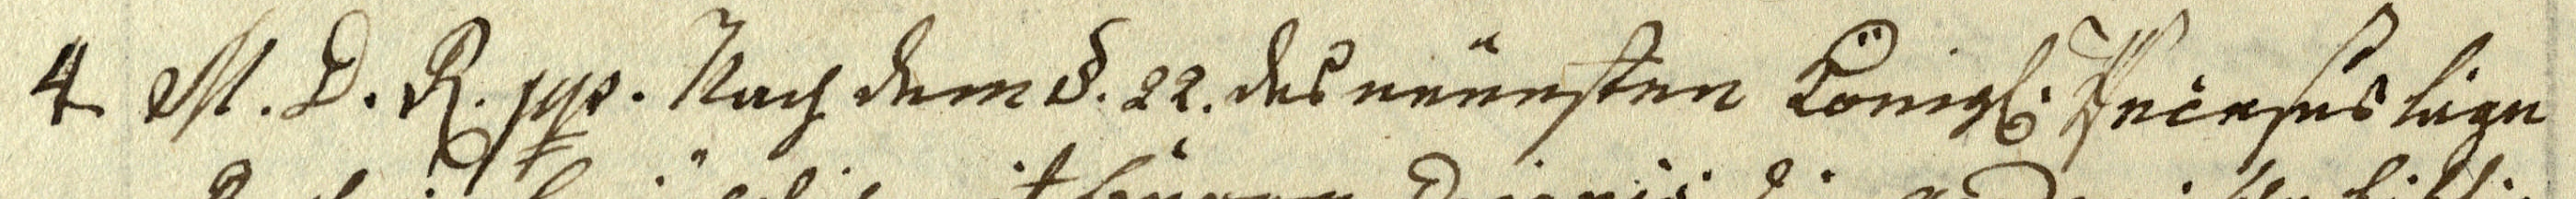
4. M. D. R. pp. Nach dem § 22. des heuesten Königl. Receßes läge
